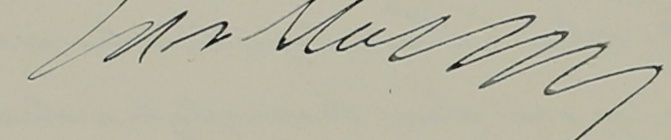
Ed.v.Stackelberg
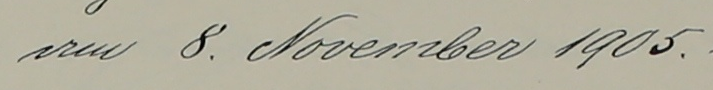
am 8. November 1905.
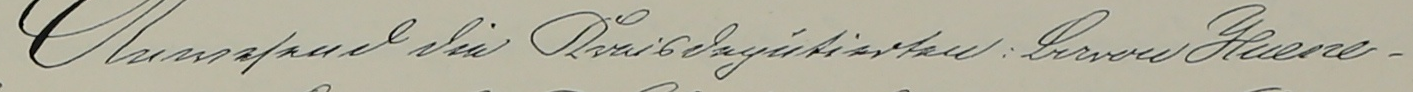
Anwesend die Kreisdeputierten: Baron Huene-
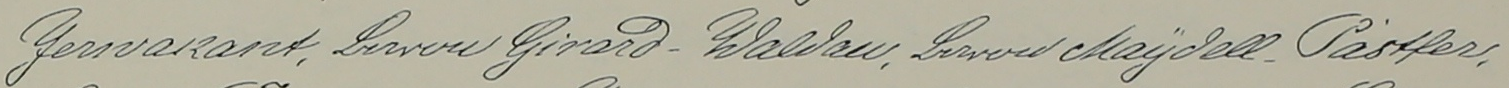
Jerwakant, Baron Girard-Waldau, Baron Maydell-Pastfer,
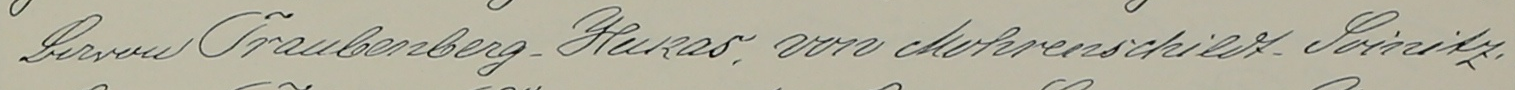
Baron Traubenberg-Hukas, von Mohrenschildt-Soinitz,
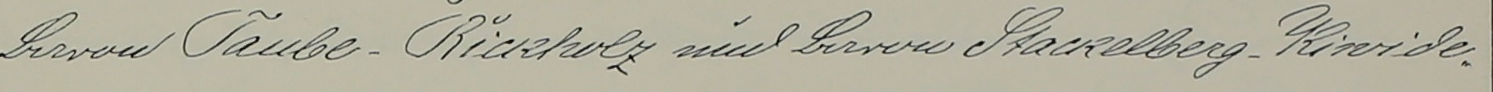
Baron Taube-Rickholz und Baron Stackelberg-Kiwide-
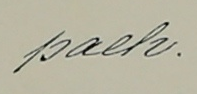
paeh.
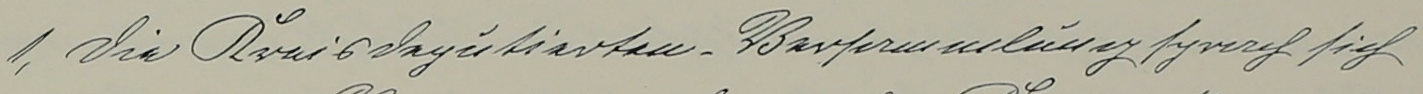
1. Die Kreisdeputierten-Versammlung sprach sich
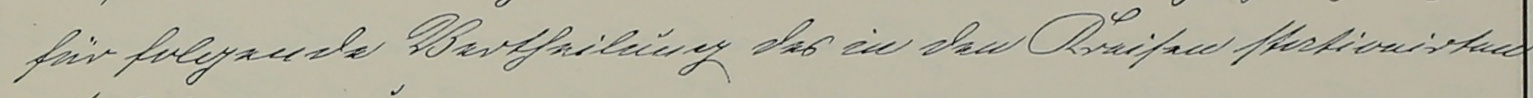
für folgende Vertheilung des in den Kreisen stationirten
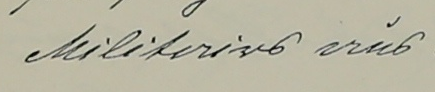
Militairs aus:
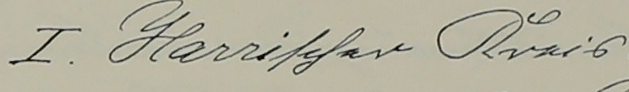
I. Harrischer Kreis:
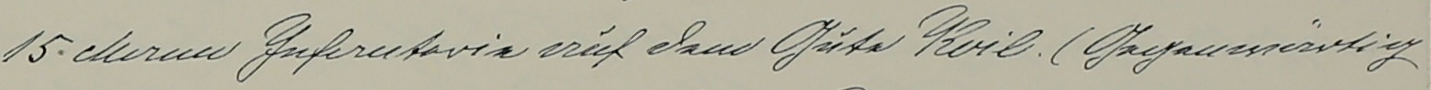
15 Mann Infanterie auf dem Gute Koil. (Gegenwärtig
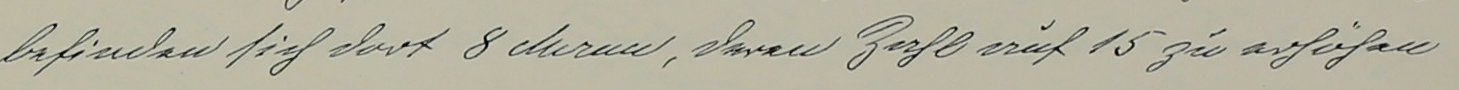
befinden sich dort 8 Mann, deren Zahl auf 15 zu erhöhen
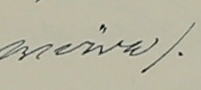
wäre).
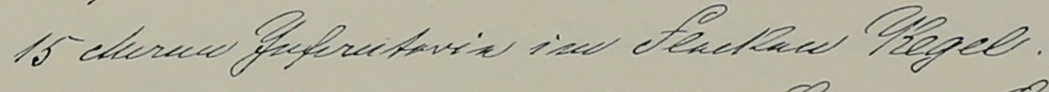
15 Mann Infanterie im Flecken Kegel.
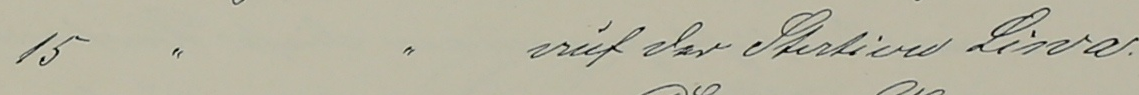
15 " " auf der Station Liwa.
